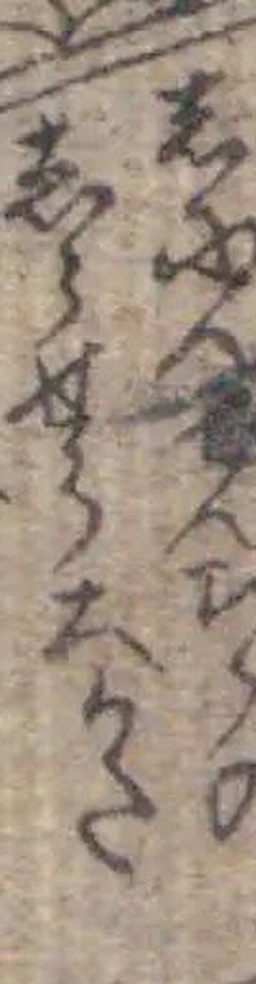しうせう大かた
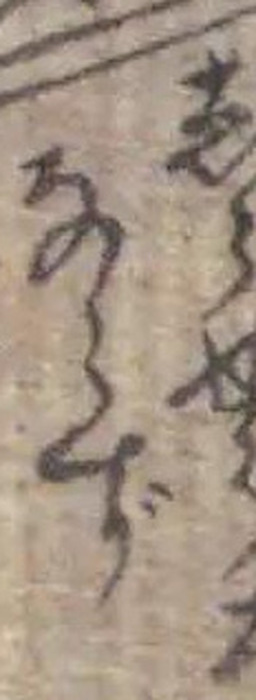ならず

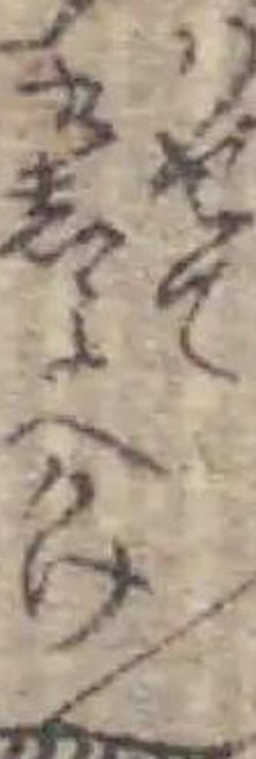御しよへかけ
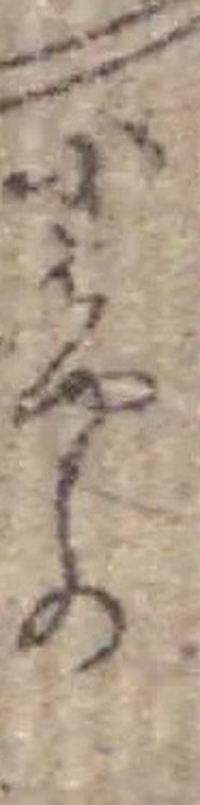小はやしの
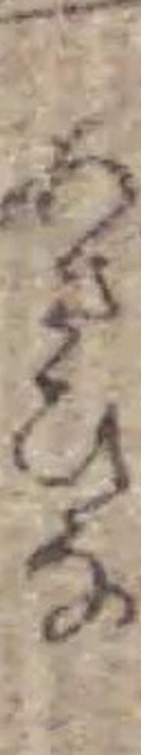あさひな
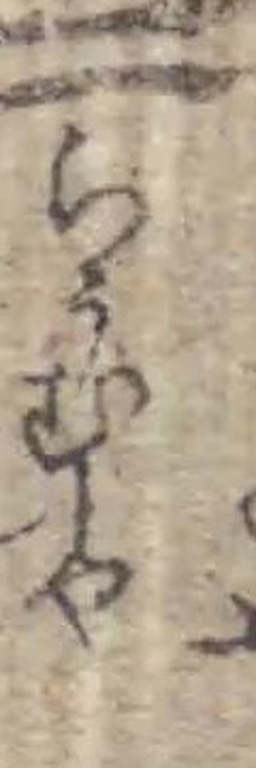らうむしや
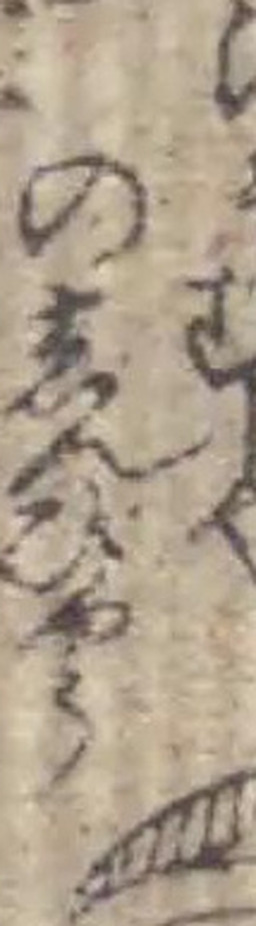のしんひやう
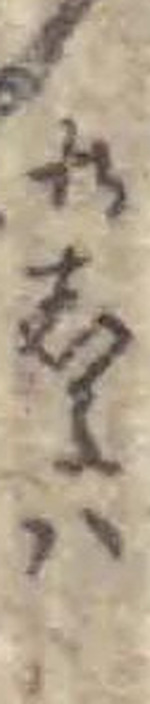御しよは
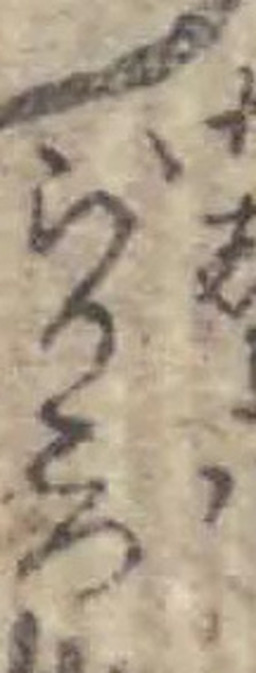らりこつ
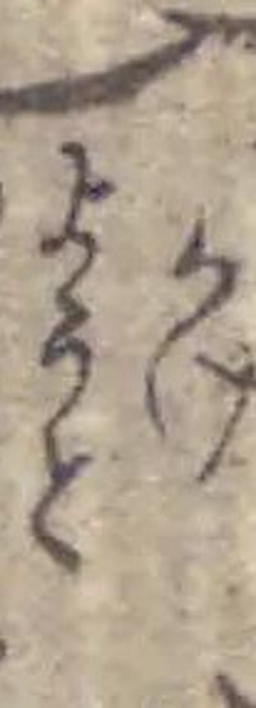ようと
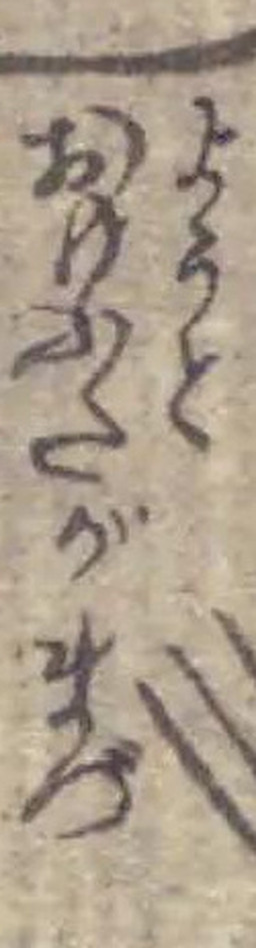おもふたがまづ
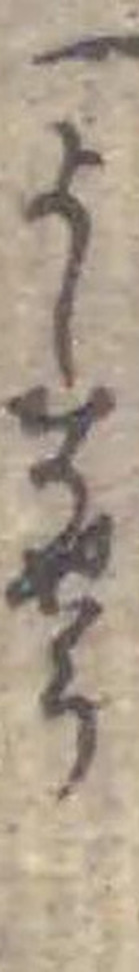よしませう
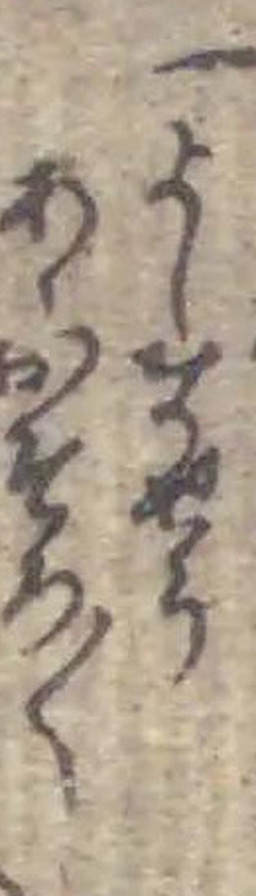あゝおそろ〳〵
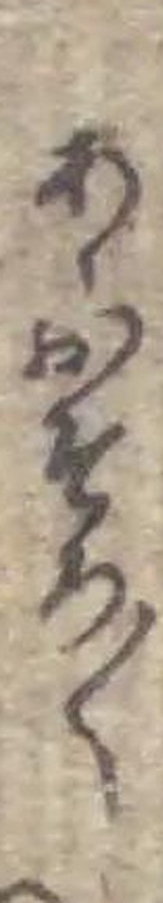あゝおそろ〳〵
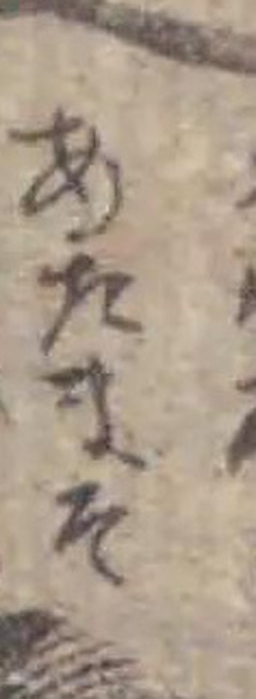あたまそ
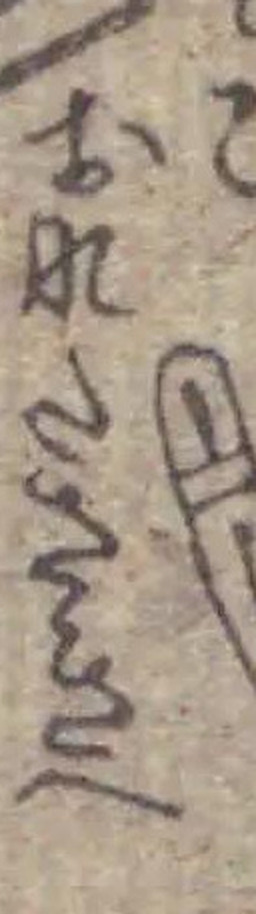おれたさきへ
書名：朝比奈島渡 3巻
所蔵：国立国会図書館 National Diet Library, JAPAN
